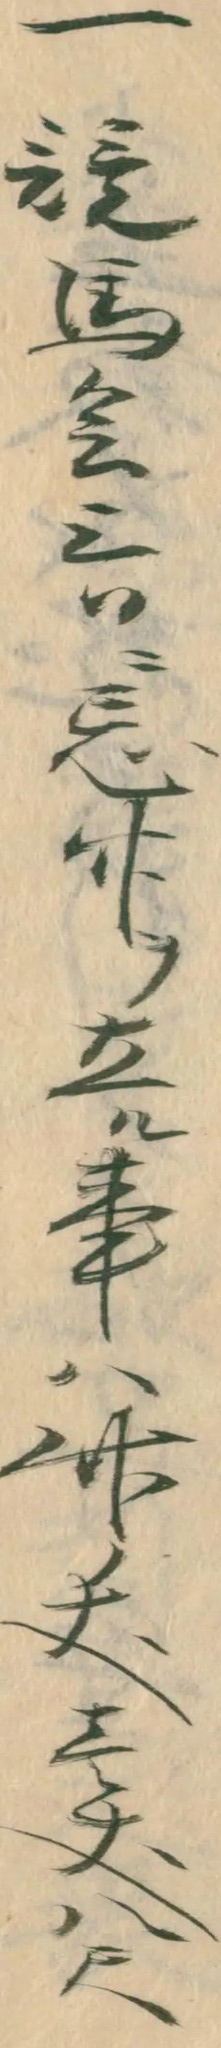一競馬会三日に忌竹を立る事は竹の丈壱丈八尺

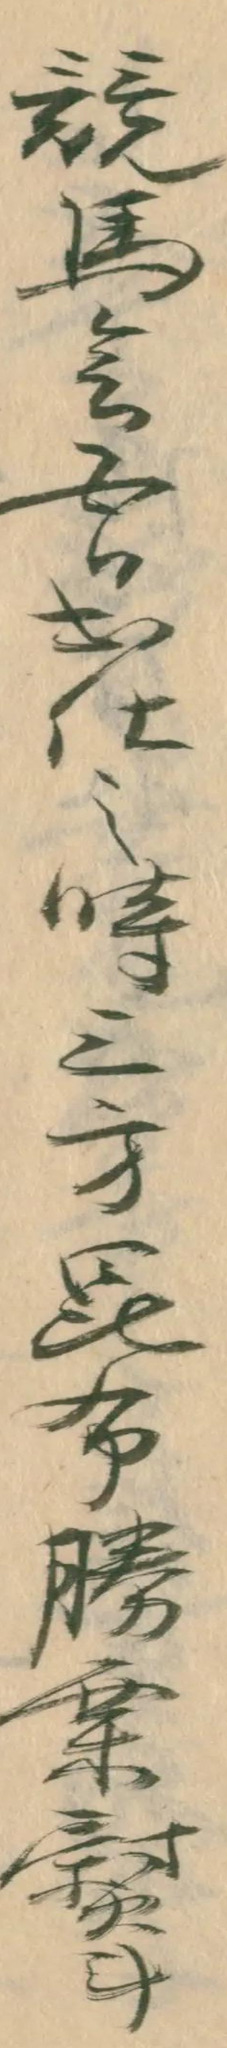一競馬会五日出仕之時三方昆布勝栗熨斗
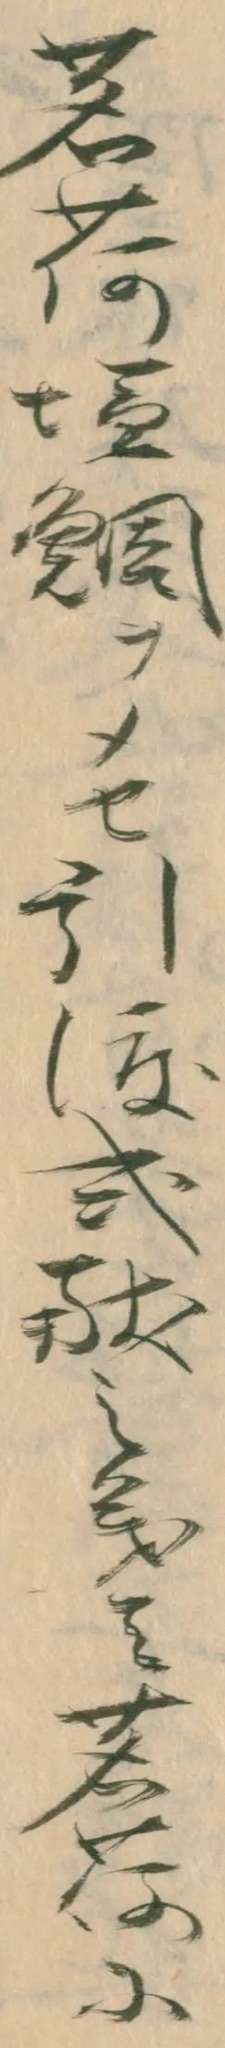茗荷塩鯛を引渡式献之義は茗荷に
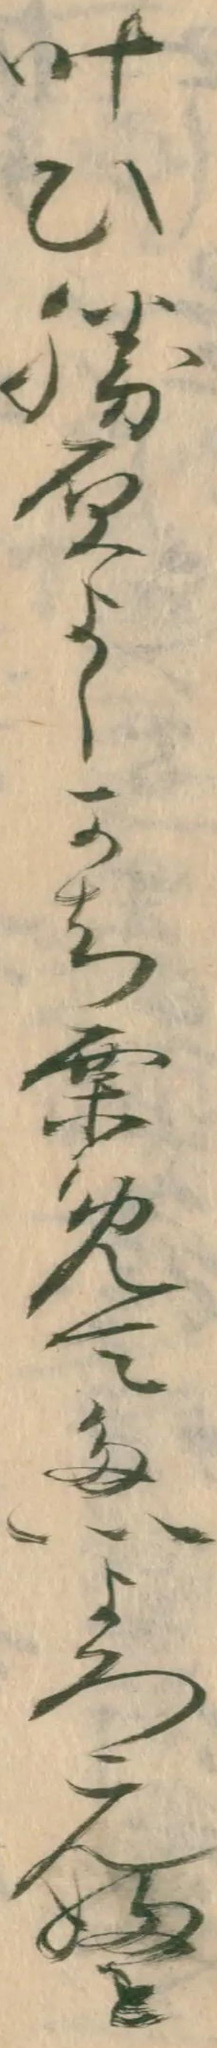叶ひ勝負よくかち栗めてたいよろこんふと
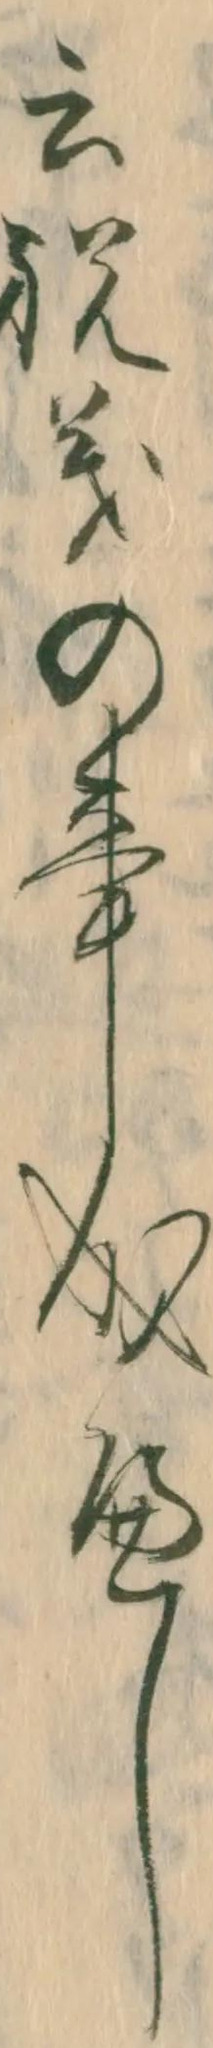云祝儀の事成へし
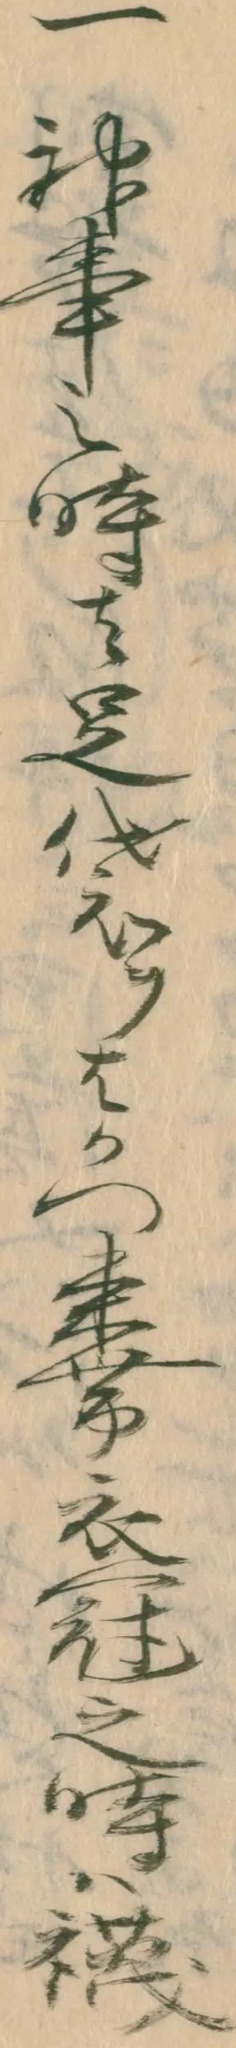一神事之時は足袋をはかつ束帯衣冠之時は襪
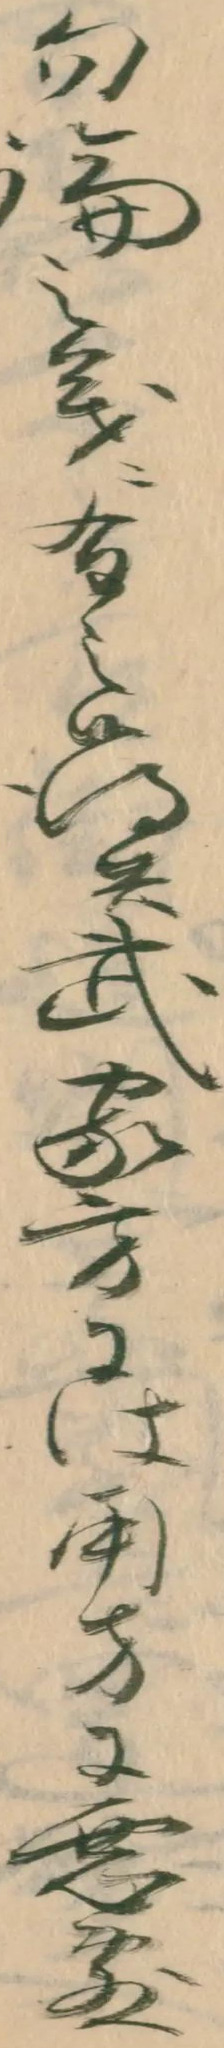勿論之義に有之候得共武家方には用方に悪敷
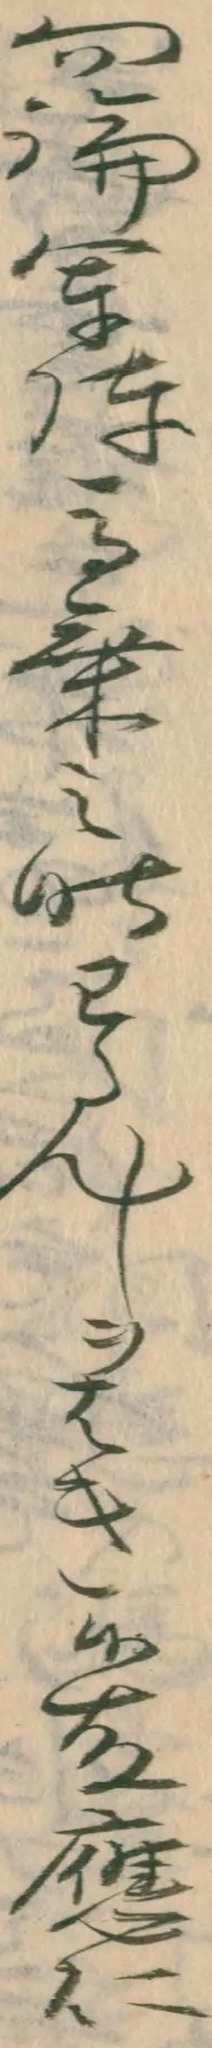勿論軍陣馬乗之時わらんしをはき候故応仁
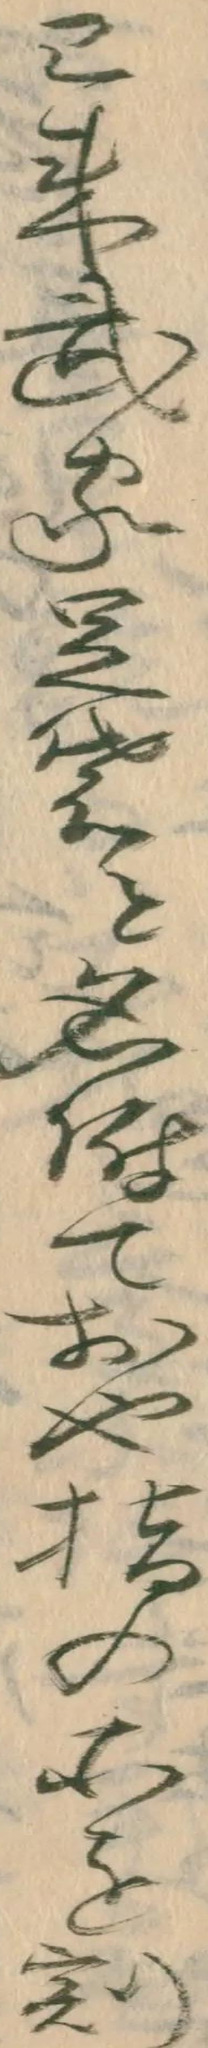已来武家足袋と名附ておや指の所を割
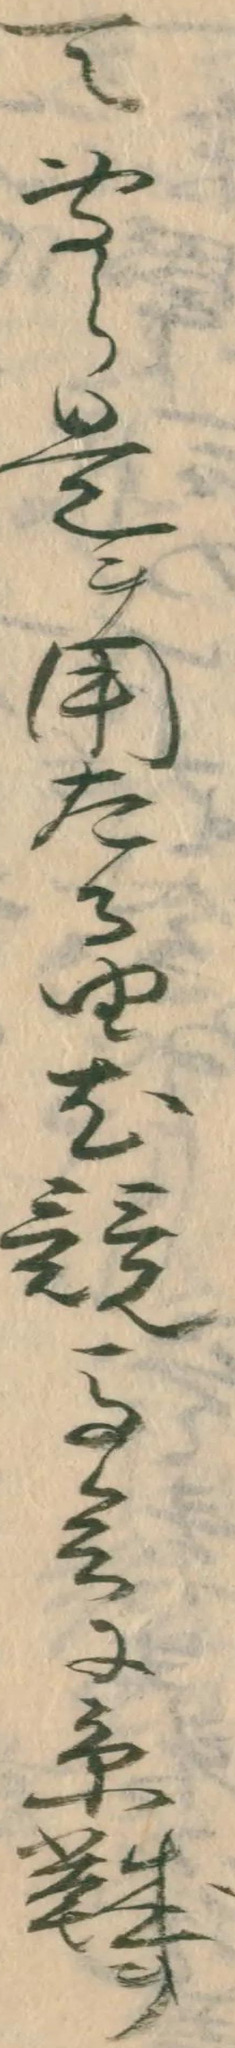て専ら是を用たる由尤競馬会に糸鞿を
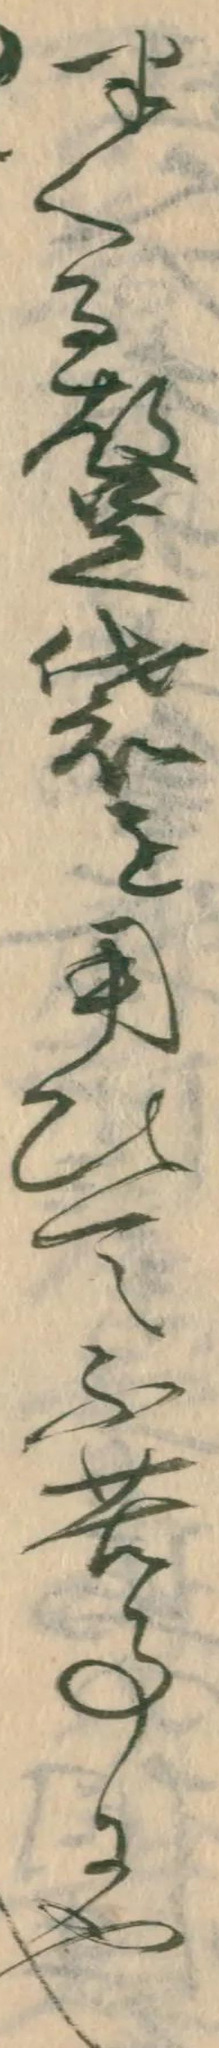つくる故足袋を用ひて不苦事にや
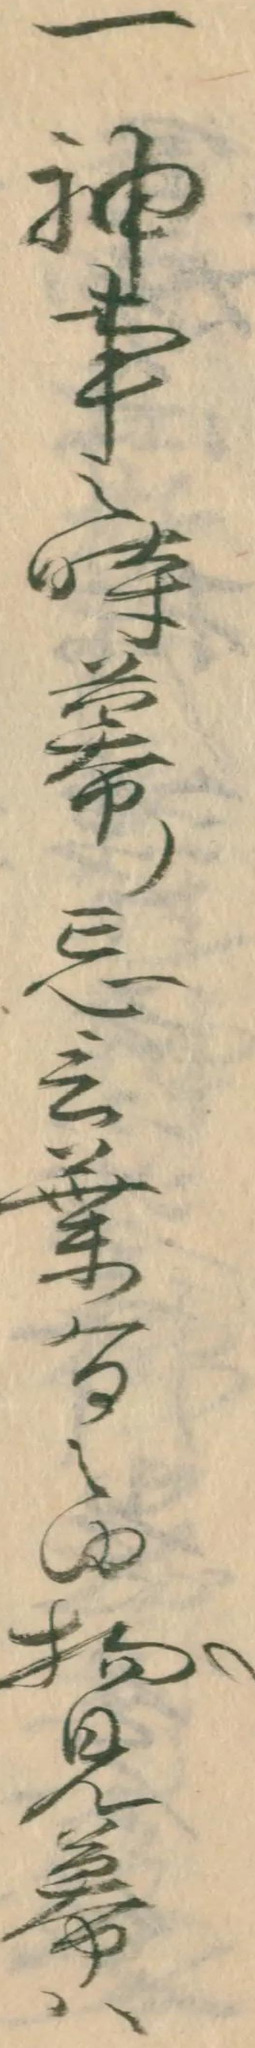一神事之時幕の忌言葉有之由物見幕は

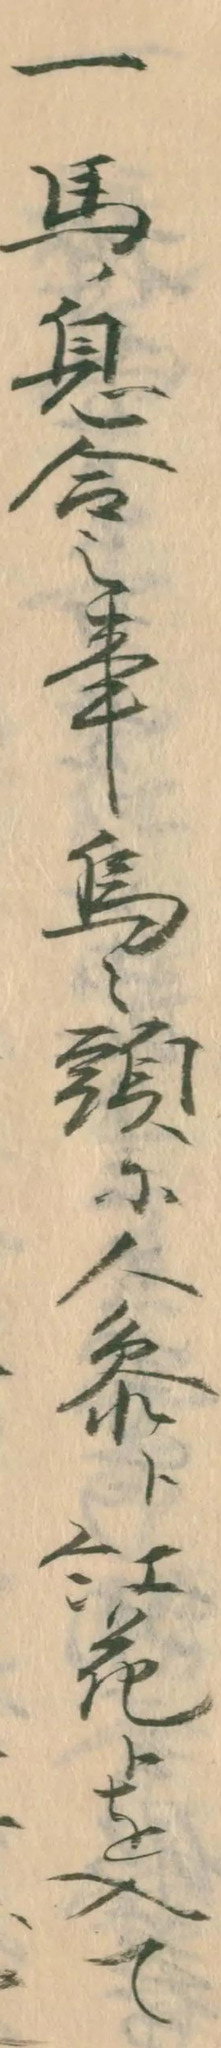一馬の息合之事烏之頭に人参と紅花とを入て
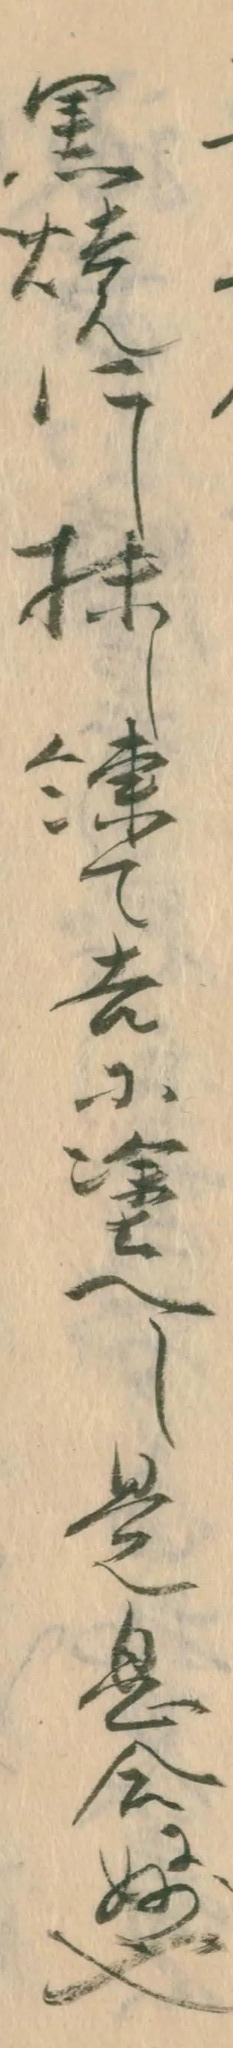黒焼にし抹し練て吉に塗へし是息合に妙也
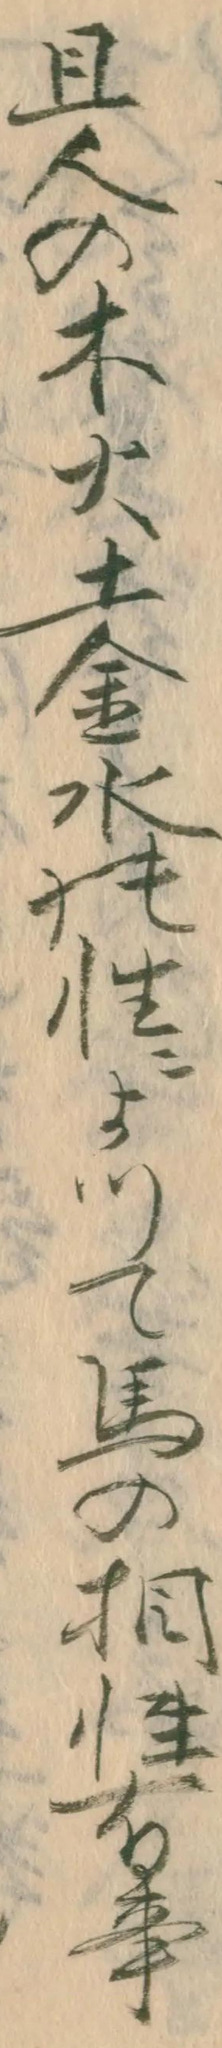且人の木火土金水の性によつて馬の相性有事
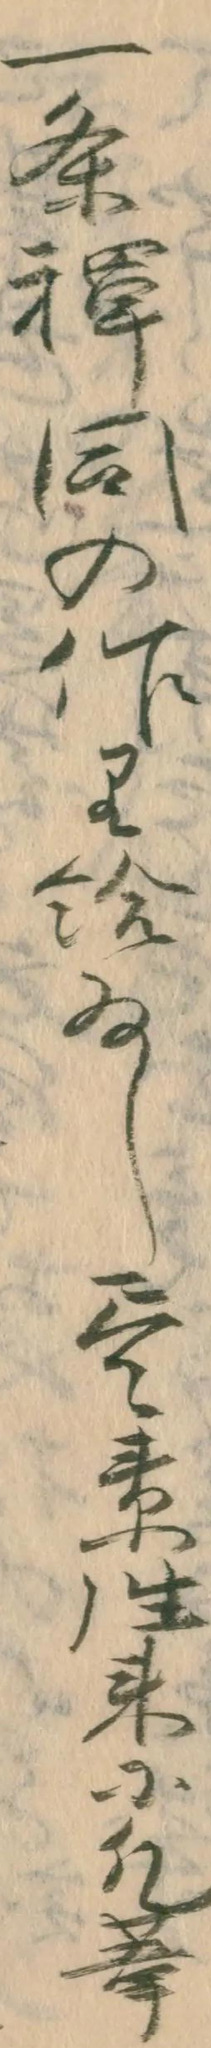一条禅同の作り給ゐし尽往来に凡葦
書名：賀茂社記録. 第12冊
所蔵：国立国会図書館 National Diet Library, JAPAN
